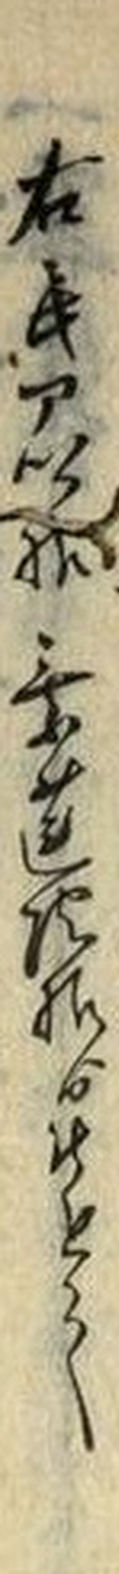右民部卿様乗蓮院様ゟ被進之
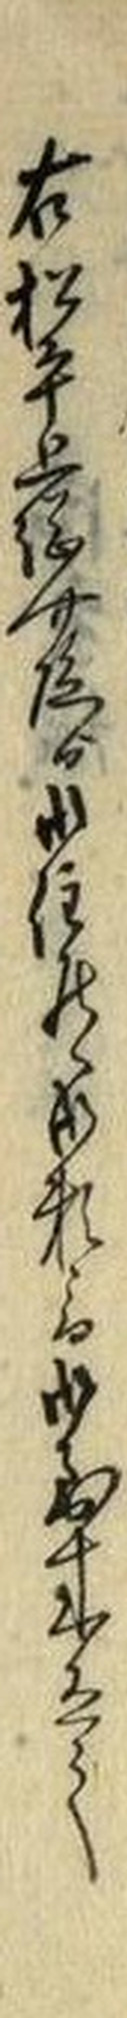右松平上総介殿ゟ御住居へ御頼ニ而御到来有之

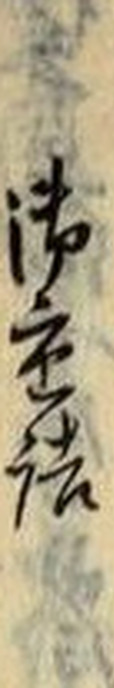御重詰
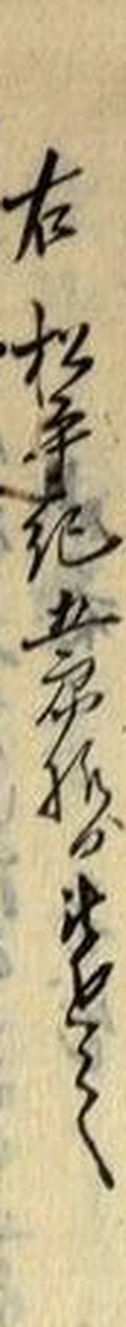右松平紀五郎様ゟ被進之
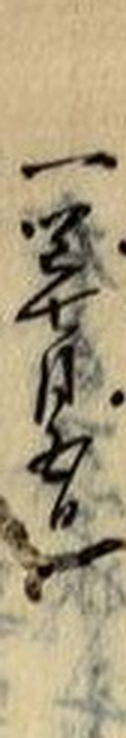一閏七月五日
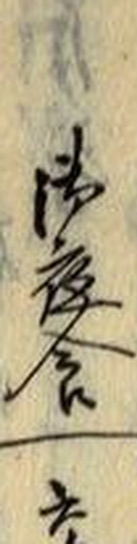御夜食
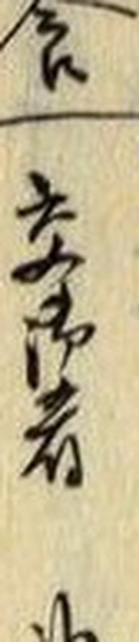交御肴
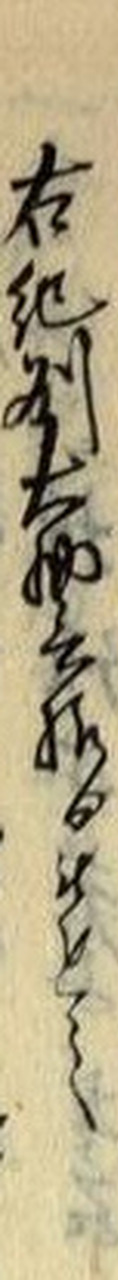右紀州大納言様ゟ被進之
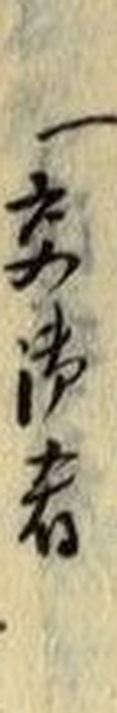交御肴
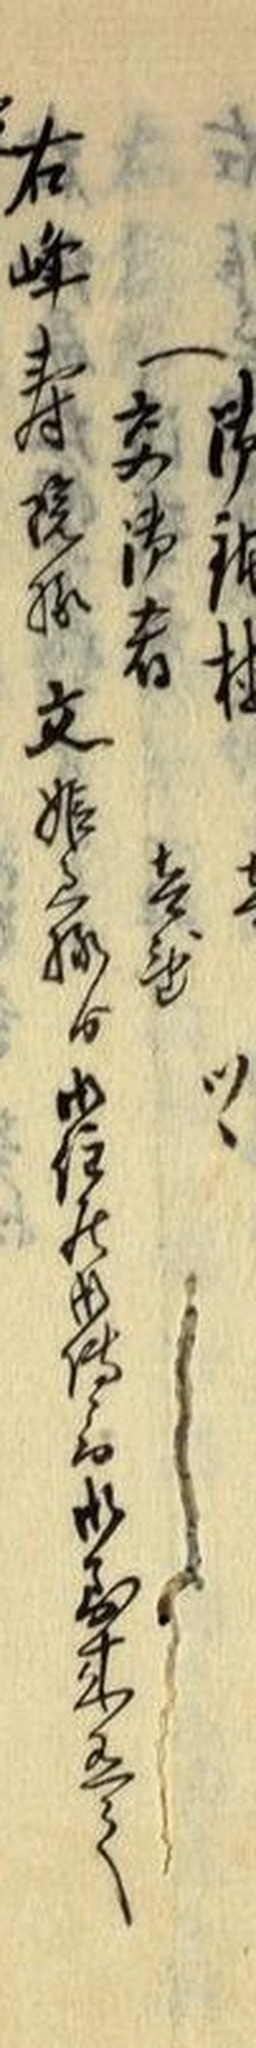右峰寿院様文姫君様ゟ御住居御伝ニ而御到来有之
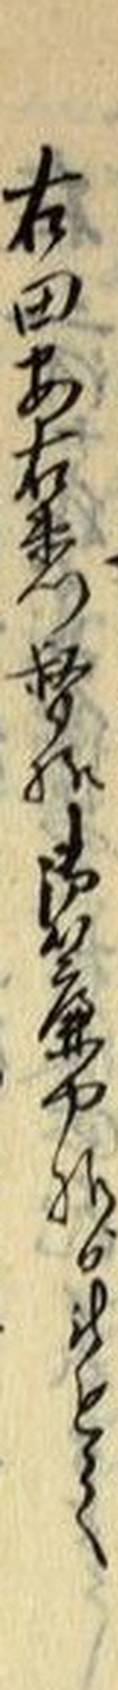右田安右衛門督様御簾中様ゟ被進之
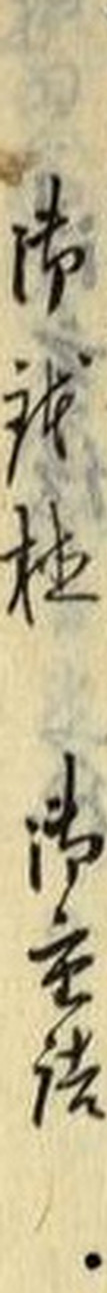御鉢植御重詰
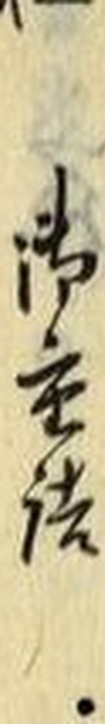御重詰
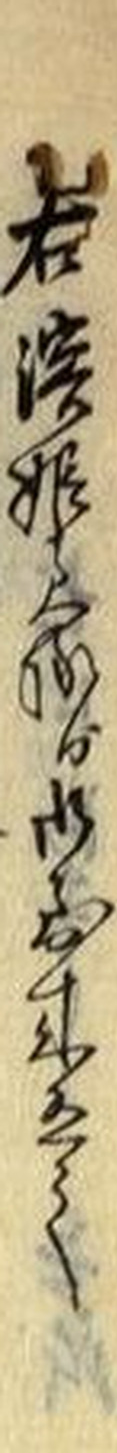右溶姫君様ゟ御到来有之
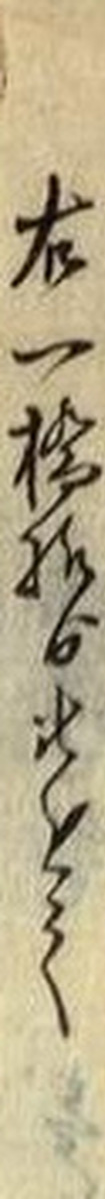右一橋様ゟ被進之
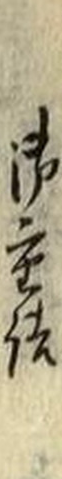御重詰
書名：少傅日録抄（斉承付側向頭取日記、在府）
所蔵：福井県文書館 Fukui Prefectural Archives
